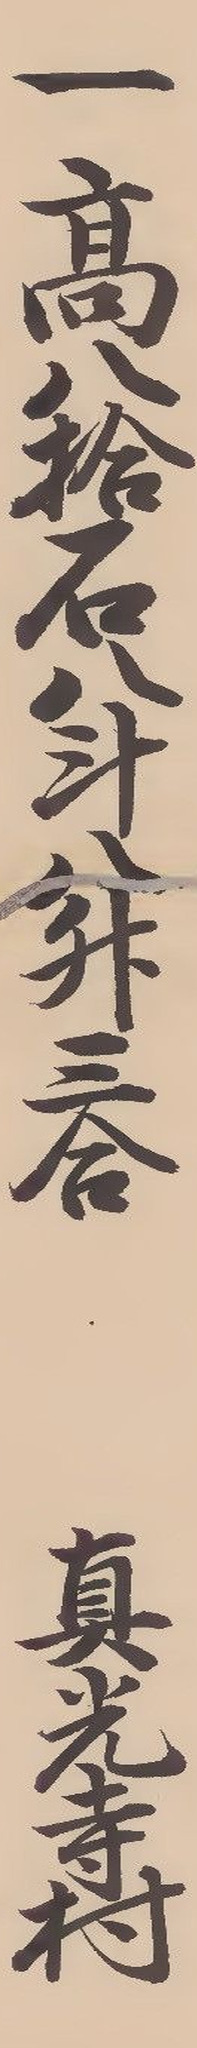一高八拾石八斗八升三合真光寺村
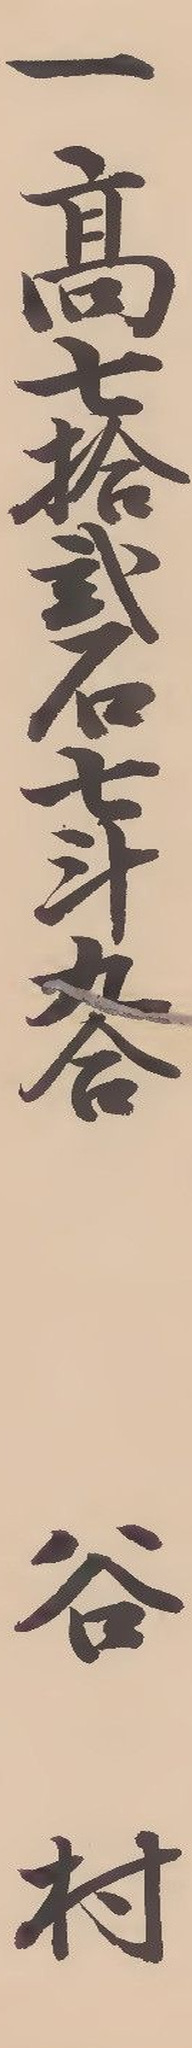一高七拾弐石七斗九合谷村

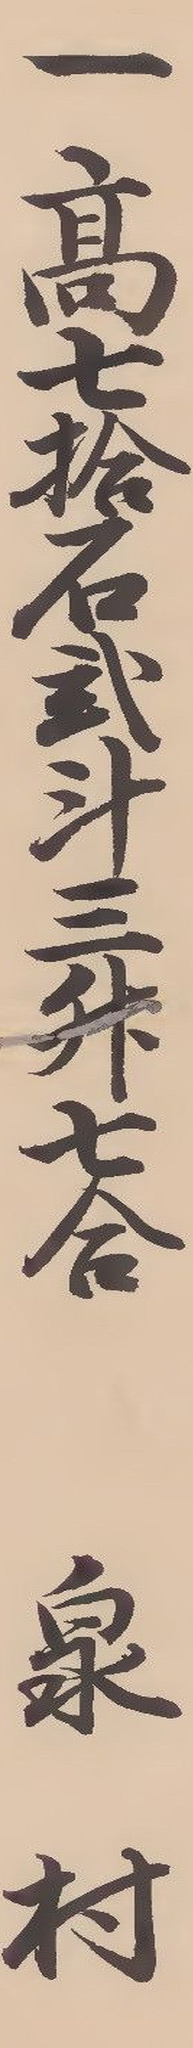一高七拾石弐斗三升七合泉村
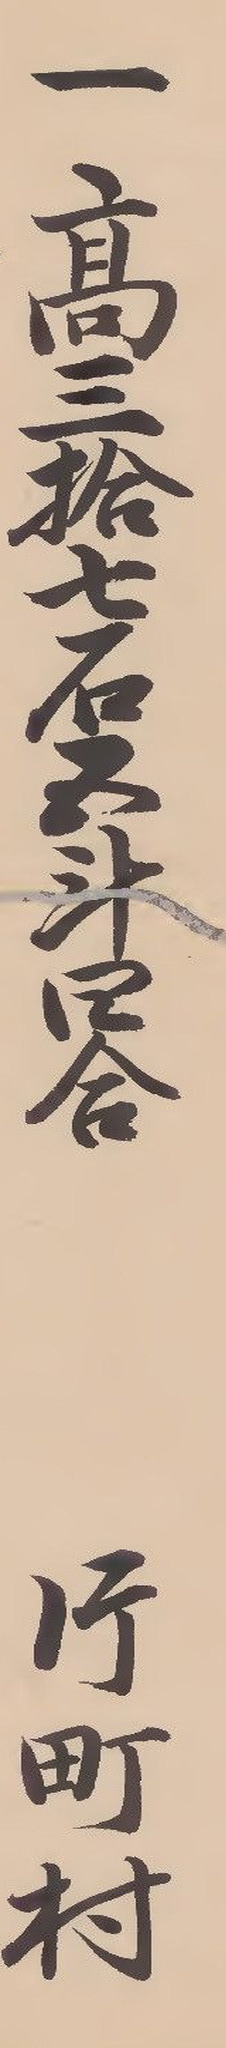一高三拾七石五斗四合片町村
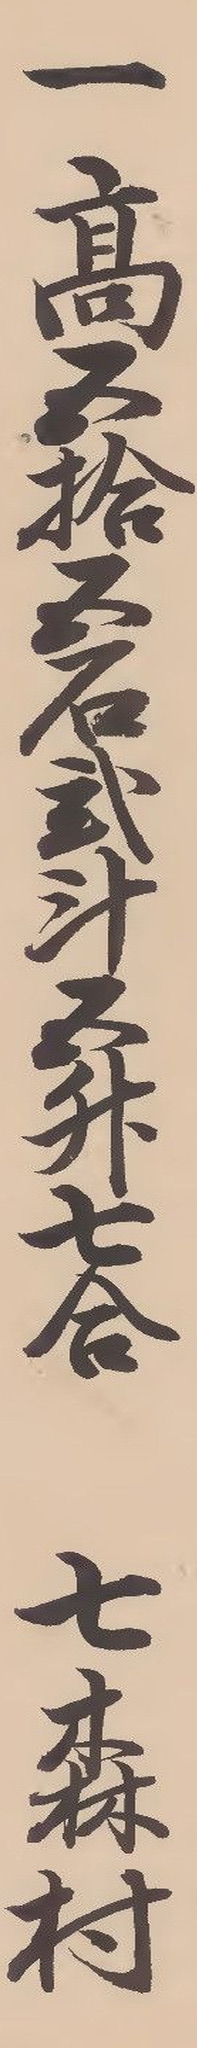一高五拾五石弐斗五升七合七森村
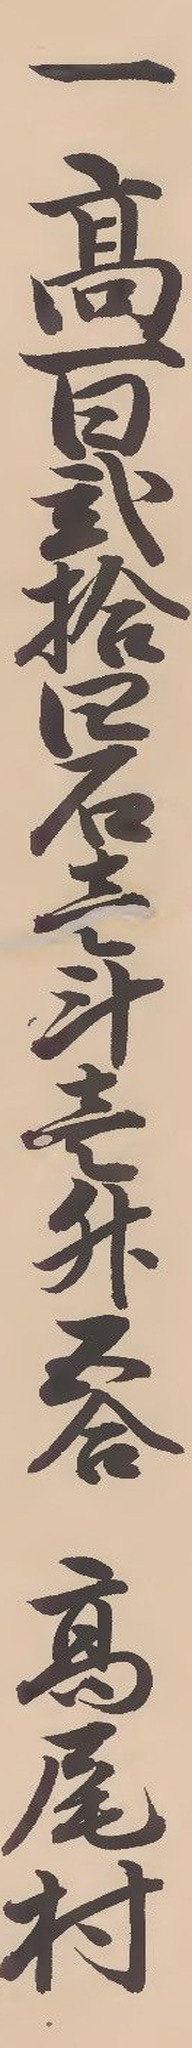一高百弐拾四石壱斗壱升五合高尾村
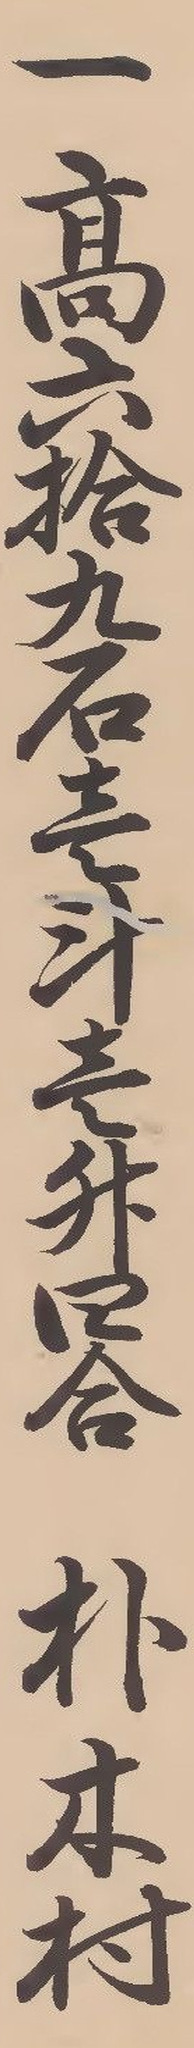一高六拾九石壱斗壱升四合朴木村
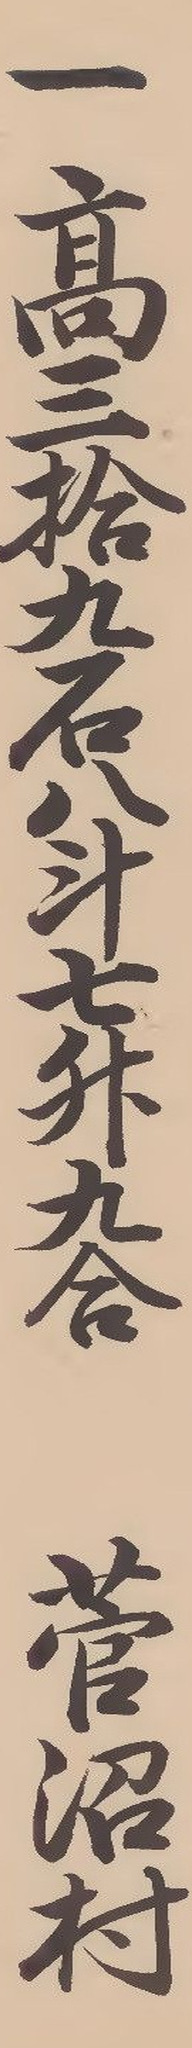一高三拾九石八斗七升九合菅沼村
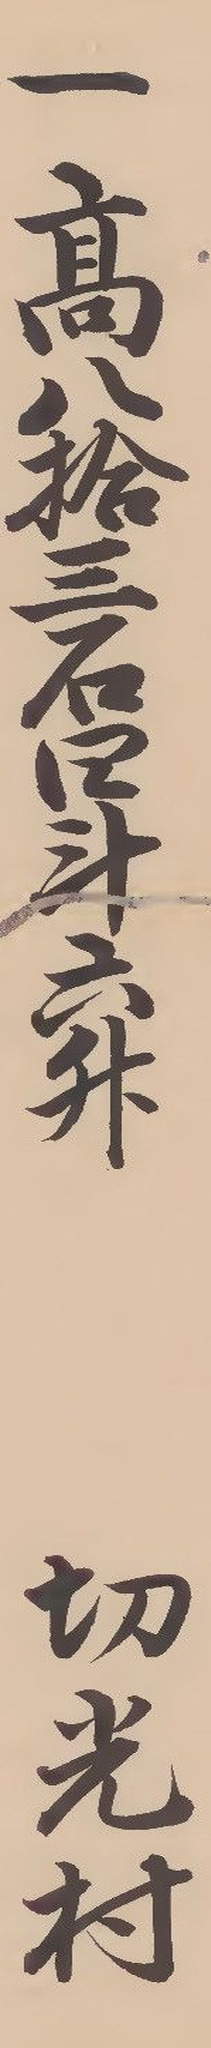一高八拾三石四斗六升切光村
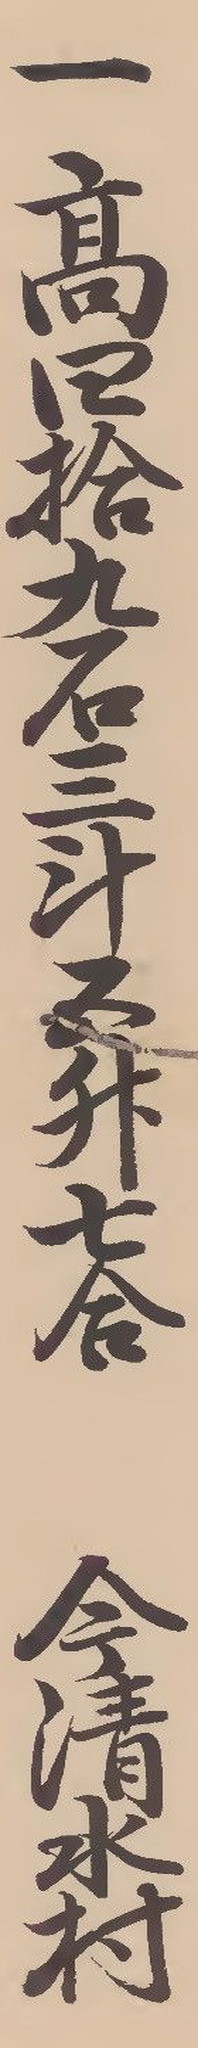一高四拾九石三斗五升七合今清水村

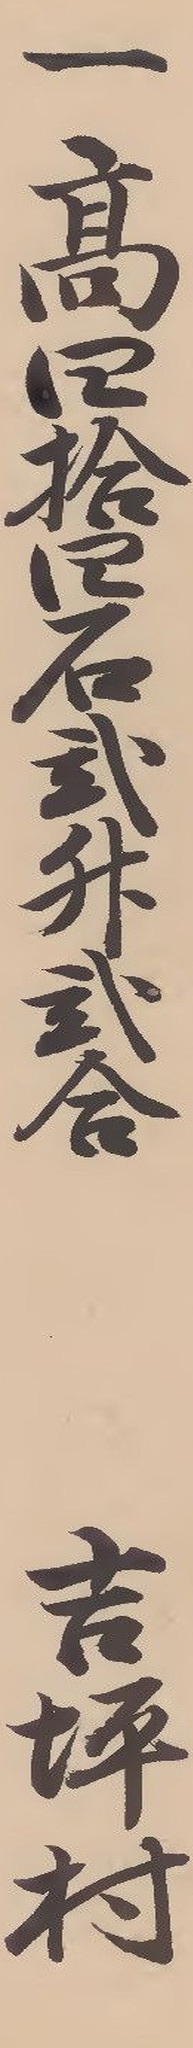一高四拾四石弐升弐合吉坪村
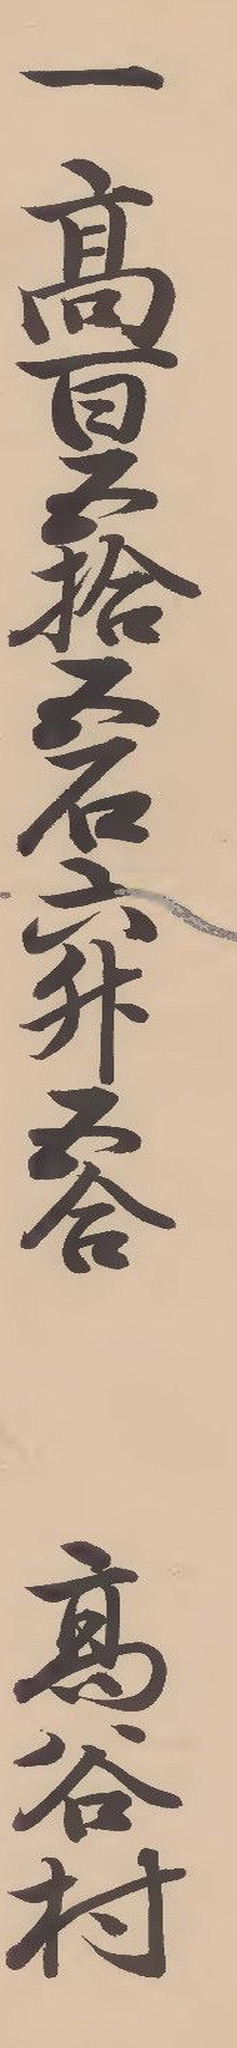一高百五拾五石六升五合高谷村
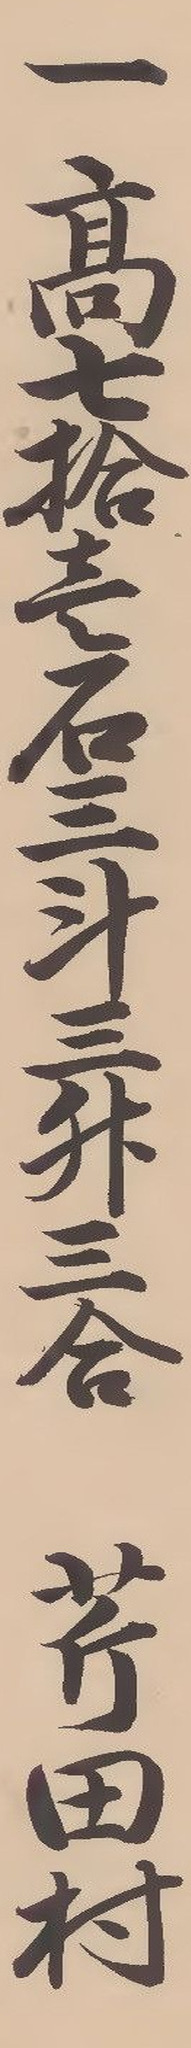一高七拾壱石三斗三升三合芹田村
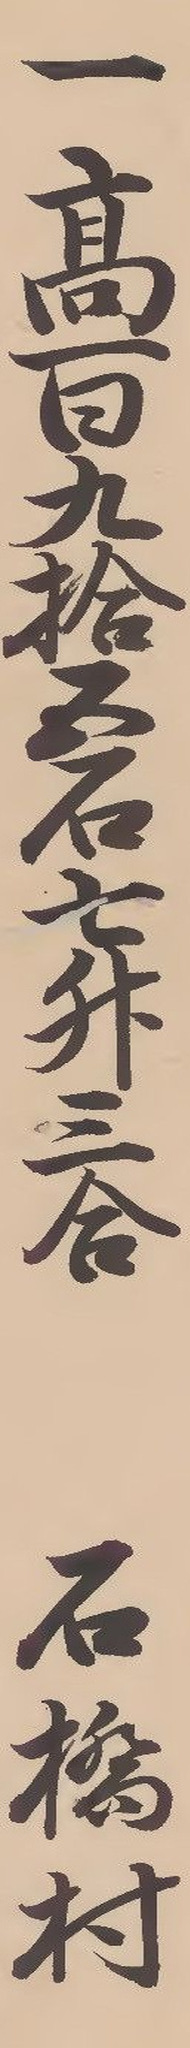一高百九拾五石七升三合石橋村
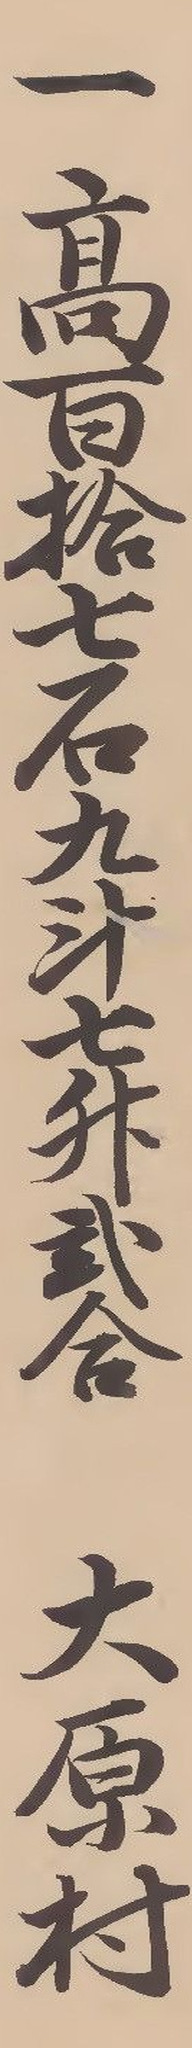一高百拾七石九斗七升弐合大原村
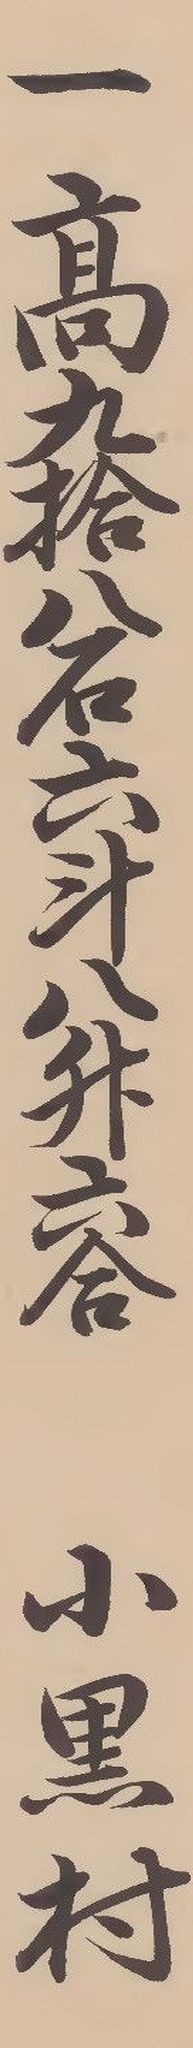一高九拾八石六斗八升六合小黒村
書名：越後国郷帳　上
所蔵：国立公文書館 National Archives of Japan
